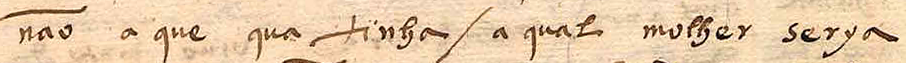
não a que qua tinha / a qual molher serya
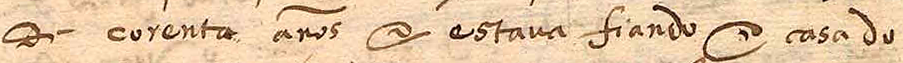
de corenta ānos e estaua fiando ē casa do
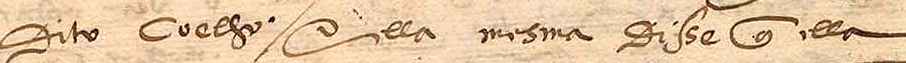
Dito Coelho / e ella mesma disse q̄ ella
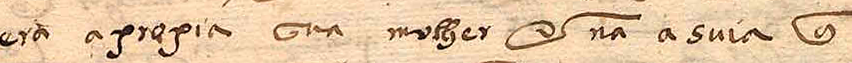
era a propia sua molher e nā a suia q̄
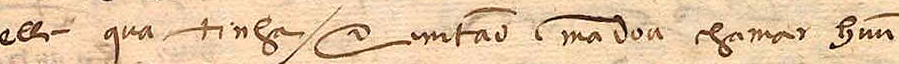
elle qua tinha / e emtão m̄adou chamar hūu
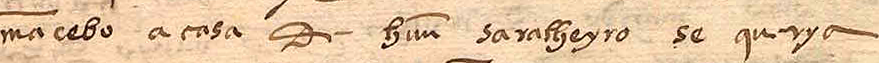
m̄acebo a casa de hūu saralheyro se querya
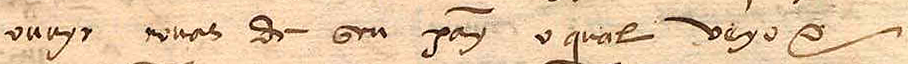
ouuyr nouas de seu pay o qual veyo e
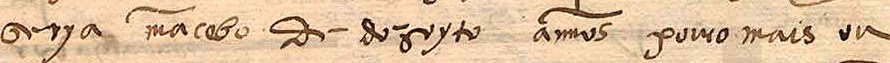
serya m̄acebo de dezoyto annos pouco mais ou
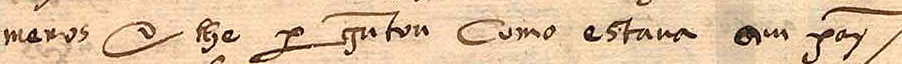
menos e lhe ꝑgūtou Como estaua seu pay /
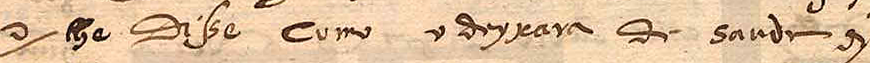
e lhe Disse como o deyxara de saude dy
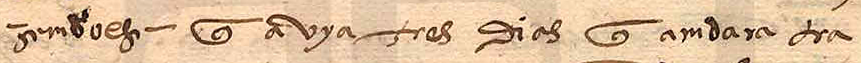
zemdolhe q̄ avya tres dias q̄ amdara tra
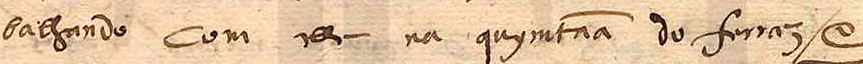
balhando com elle na quymtāa do ferraz / e
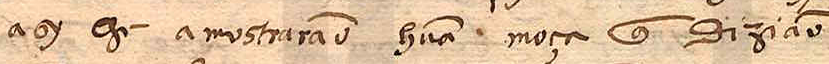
asy lhe amostrarão hūa moça q̄ diziaõ
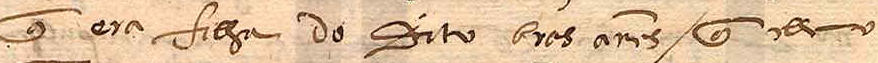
q̄ era filha do dito bras an̄es / q̄ elle o
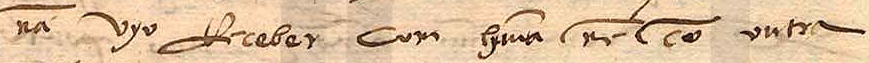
n̄a vyo Receber com hūua n̄e c̄o outra
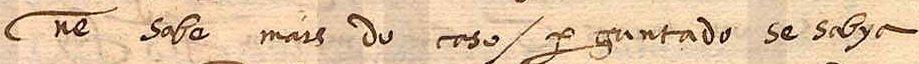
n̄e sabe mais do caso / ꝑguntado se sabya
